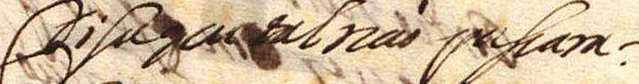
Disse que tal naõ passara.
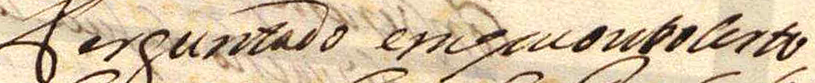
Perguntado em que outro certo
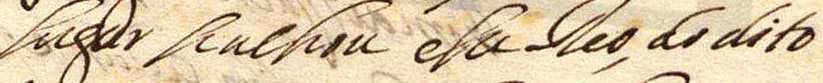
lugar se achou elle Reo, do dito
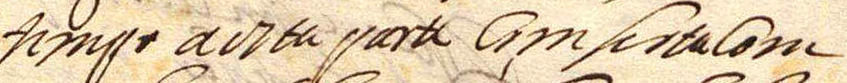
tempo a esta parte com serta com
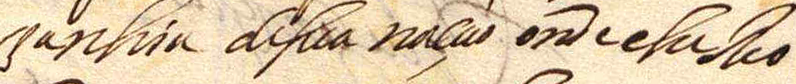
panhia de sua naçaõ onde elle Reo
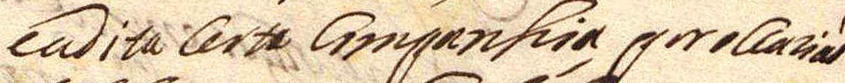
e a dita certa companhia por occaziaõ
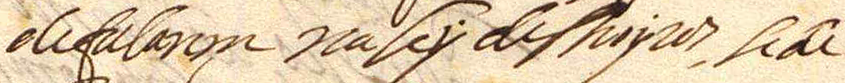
de falarem na ley de Moyzes, se de
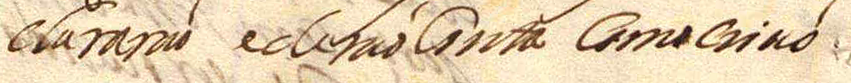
clararaõ e deraõ Conta como criaõ
